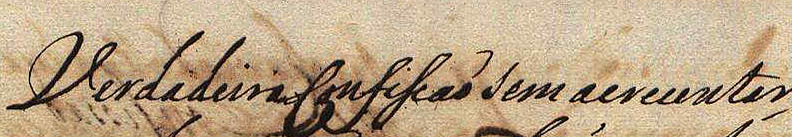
Verdadeira Confissaõ sem acrecentar
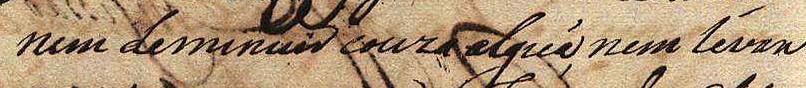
nem deminuir couza alguā, nem levan
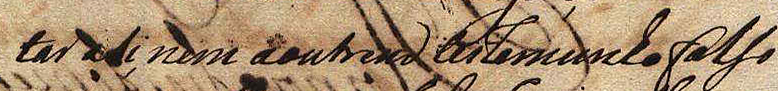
tar a si, nem a outrem testemunho falso
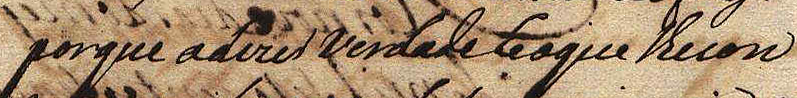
porque a dizer verdade he o que lhe con
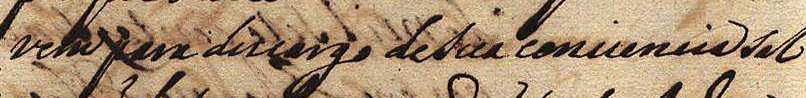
vem para descargo de sua conciencia sal
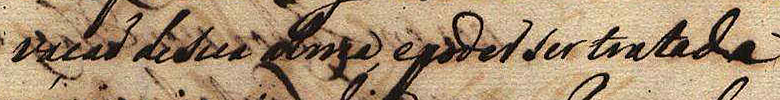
vaçaõ de sua alma, e poder ser tratada
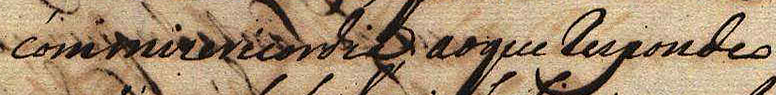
com mizericordia, ao que Respondeo
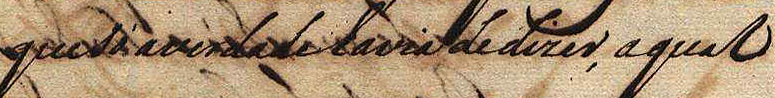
que só a verdade havia de dizer, a qual
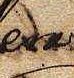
era
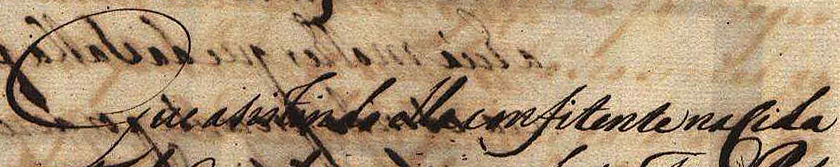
Que asistindo ella confitente na Cida
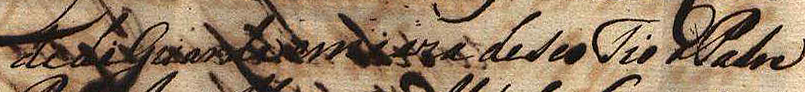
de da Guarda em caza de seo Tio o Padre
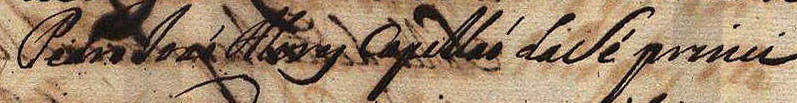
Pedro Iozé Alvres Capellaõ da Sé princi
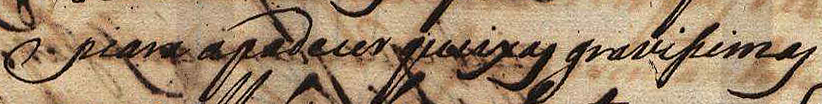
piara a padecer queixas gravissimas
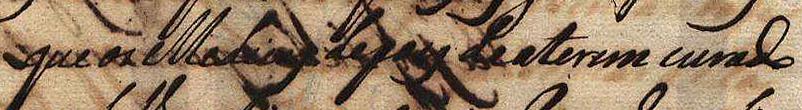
que os Medicos depois de a terem curado
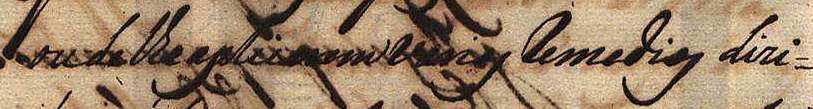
ou de lhe aplicarem varios Remedios dizi
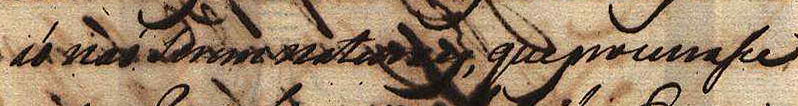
aõ naõ serem naturaes, que procurasse
